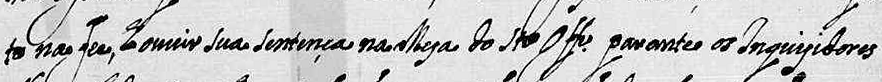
to na fee, E ouuir sua sentença na Mesa do Sto Off.o parante os Inquisidores
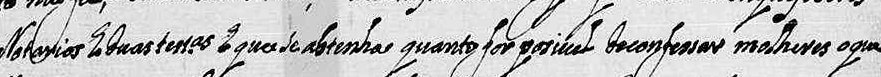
Notarios E duas test.as E que se abtenha quanto for posiuel de confessar molheres o que
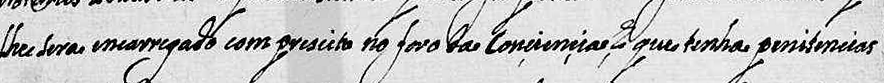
lhe sera encarregado com preseito no foro da conciencia, E que tenha penitencias
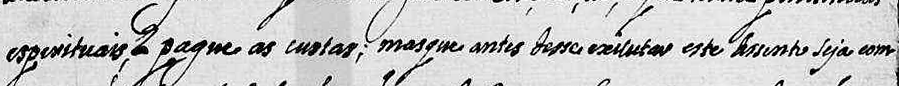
esperituais, E pague as custas; mas que antes de sse executar este Assento seja com
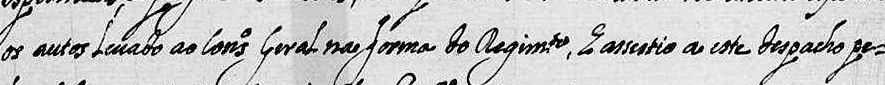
os autos leuado ao Conso Geral na forma do Regimto, E assestio a este despacho pe
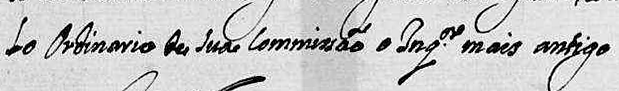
lo Ordinario de sua commissaõ o Inq.or mais antigo
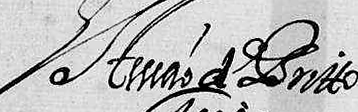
Esteuaõ de Britto
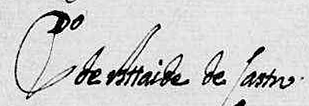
Po de Ataide de Castro.
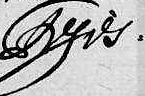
Fojos.
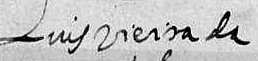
Luis vieira da
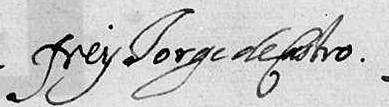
frey Jorge de Castro.
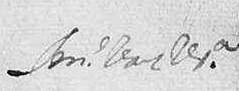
Im.o Vaz Vr.a
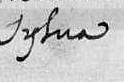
Sylua
